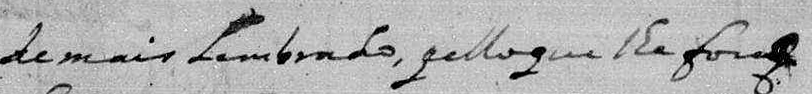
de mais Lembrado, pello que lhe foraõ
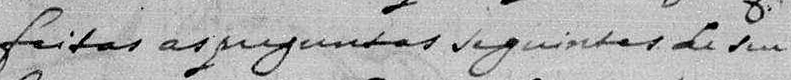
feitas as preguntas seguintes de seu
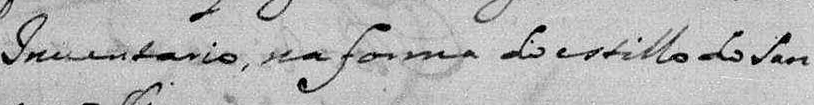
Inuentario, na forma do estillo do san
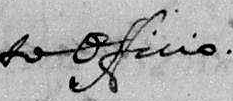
to officio.
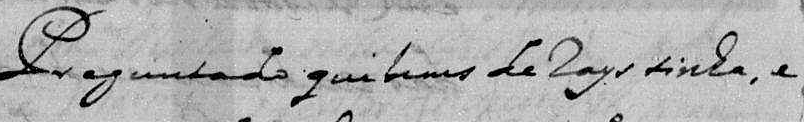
Preguntado que bems de Rays tinha, e
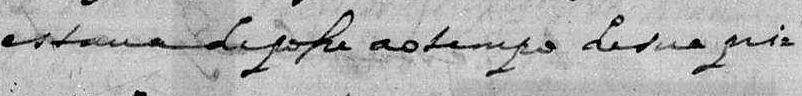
estaua de posse ao tempo de sua pri
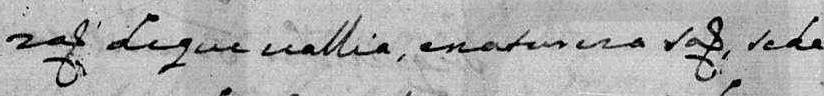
zaõ de que uallia, e natureza saõ se de
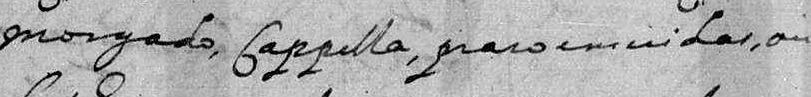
morgado, Cappella, prazo em uidas, ou
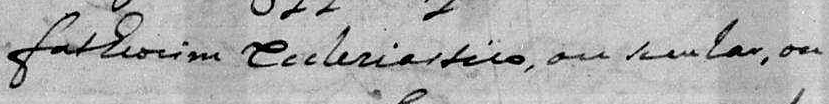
fatheozim Eccleziastico, ou secular, ou
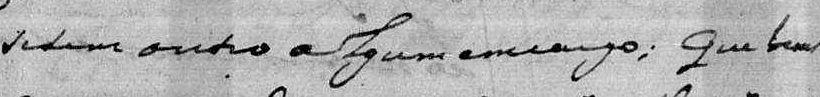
se tem outro algum emcargo; Que bems
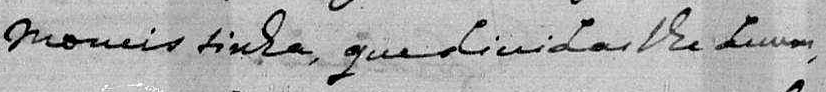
moueis tinha, que diuida lhe deuian
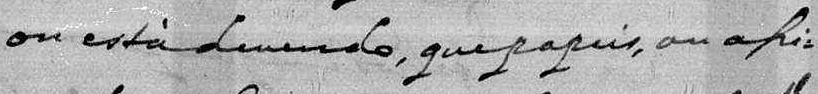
ou està deuendo, que papeis, ou assi
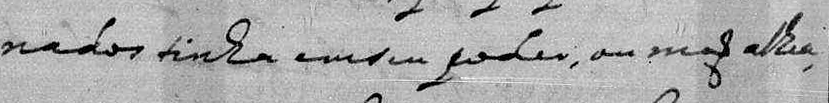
nados tinha em seu poder, ou maõ alhea,
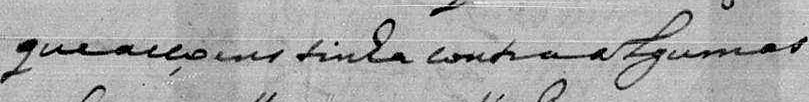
que acçoens tinha contra algumas
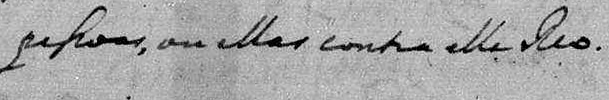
pessoas, ou ellas contra elle Reo.
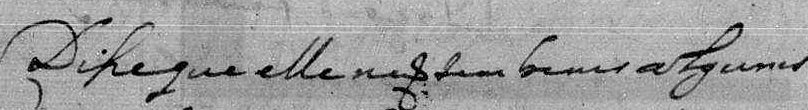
Disse que elle naõ tem bems algums
